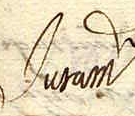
Juramto
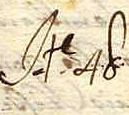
Jd̄e. 48.
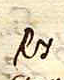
Rs
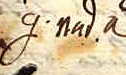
g. nad.a
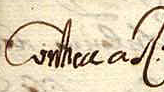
Conhece a R.
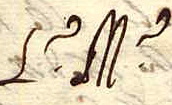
1.o M.o
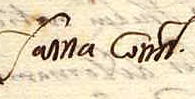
fassa const.
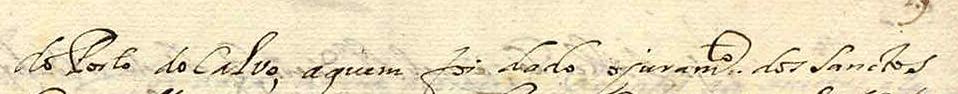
do Porto do Calvo, a quem foi dado o juramto. dos Sanctos
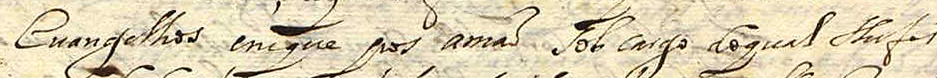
Euangelhos em que pos a maõ sob cargo do qual lhe foi
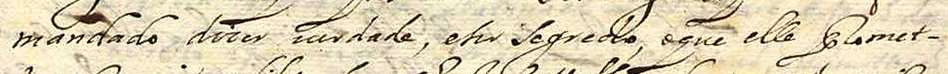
mandado dizer uerdade, e ter segredo, e que elle promet
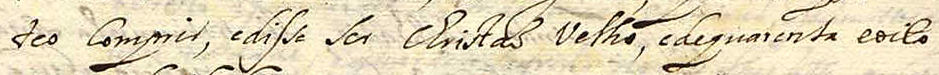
teo Comprir, e disse ser Christaõ velho, e de quarenta e oito
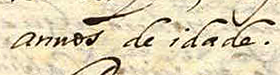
annos de idade.
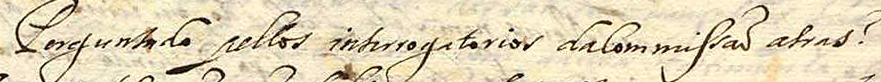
Perguntado pellos interrogatorios da Commissaõ atras?
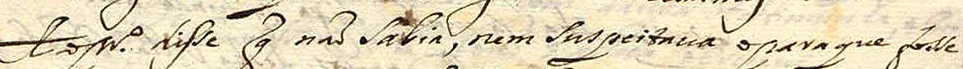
Ao pr.o disse q̄ naõ sabia, nem suspeitaua o para que fosse
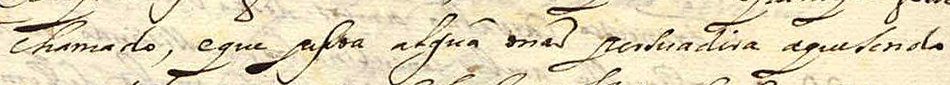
chamado, e que pessoa alguā o naõ persuadira a que sendo
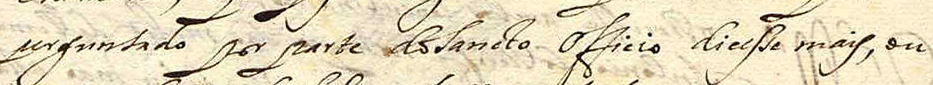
perguntado por parte do Sancto Officio dicesse mais, ou
